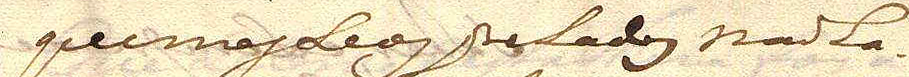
que mes seos prelados naõ ha
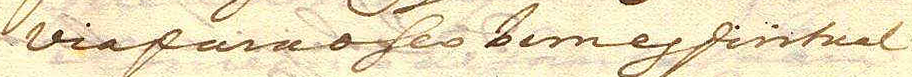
via para o seo bem espiritual
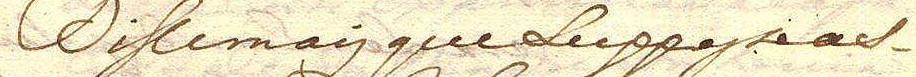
Disse mais que suppos.te as
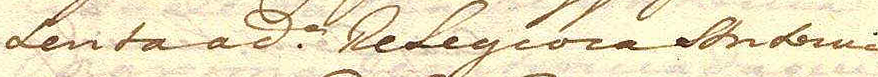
senta a d.a Relegioza Antonia
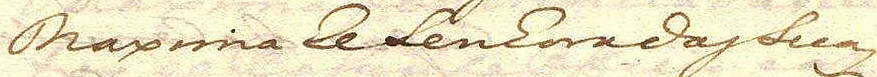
Maxima Re Senhora das suas
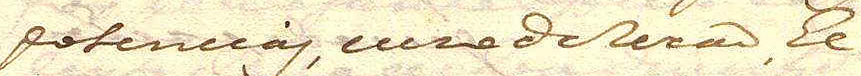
potencias, e uzo da Razão, he
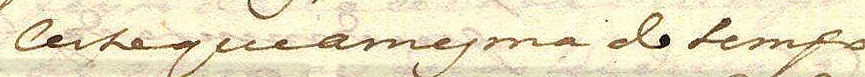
certo que a mesma do tempo
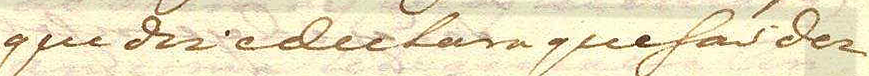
que diz e declara que saõ dez
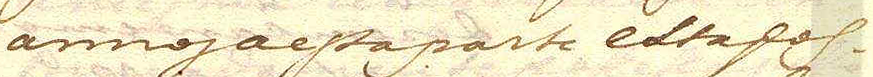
annos a esta parte esta pos
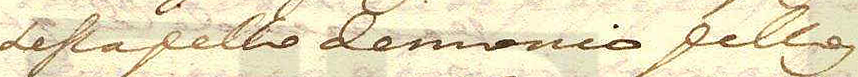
sessa pello demonio pellos
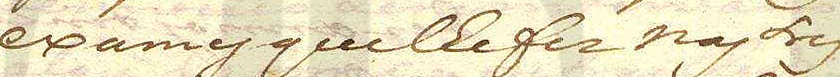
exames que lhe fez nas tres
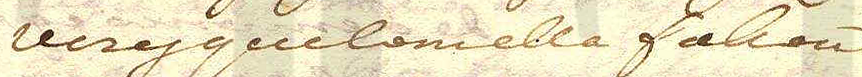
vezes que com ella fallou
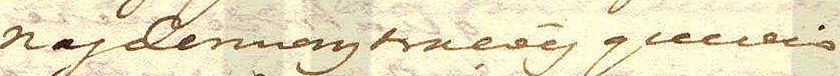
nas demonstrações que vio
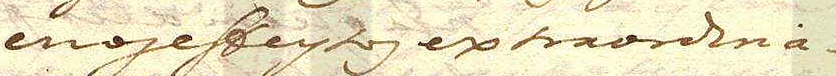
e nos effeytos extraordina
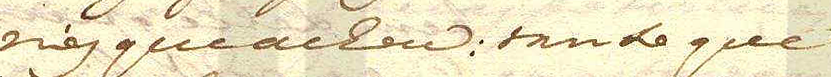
rios que achou: tanto que
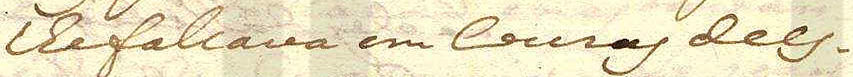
lhe fallava em Couzas de es
